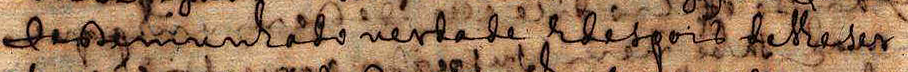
testemunhado uerdade E despois de lhe ser
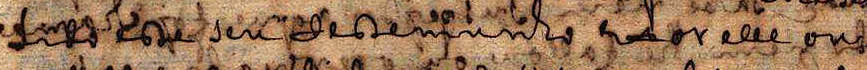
lido este seu testemunho E por elle ou
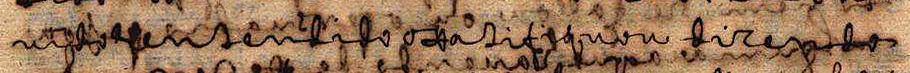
uido E entendido o Ratifiquou dizendo
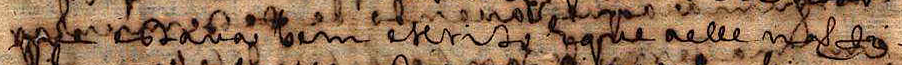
que estaua bem escrito E que a elle naõ ti
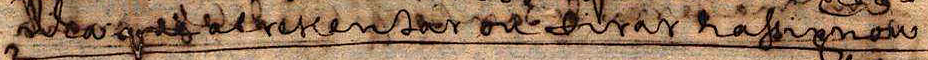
nha que acrescentar ou tirar E assignou
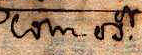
com o sor.
